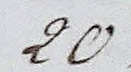20
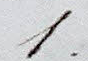1
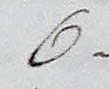6
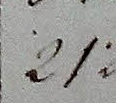21
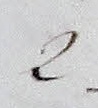2
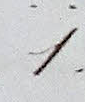1
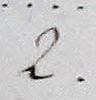2
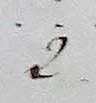2
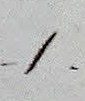1
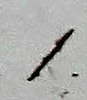1
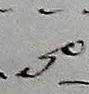5
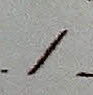1
